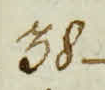38
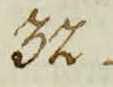32
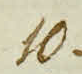10
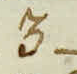3
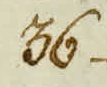36
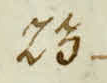23
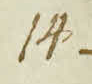14
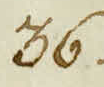36
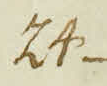24
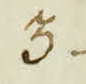3
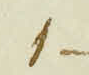1
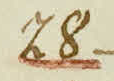28
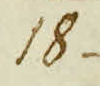18
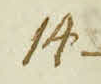14
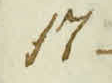17
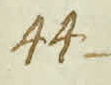44
